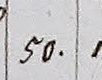50.
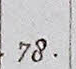78
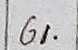61
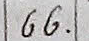66
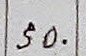50
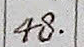48
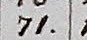71.
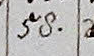58.
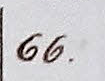66.
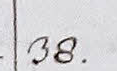38.
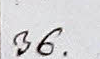36.
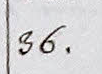36.
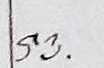53.
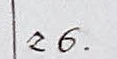26.
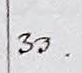33
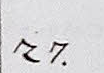27.
